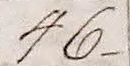46
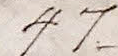47
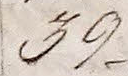39
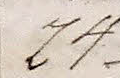24
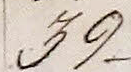39
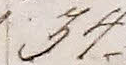34
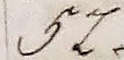52
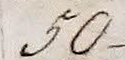50
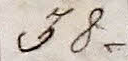38
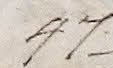47
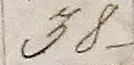38
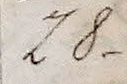28
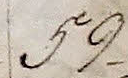59
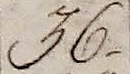36
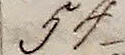54
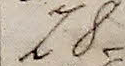28
